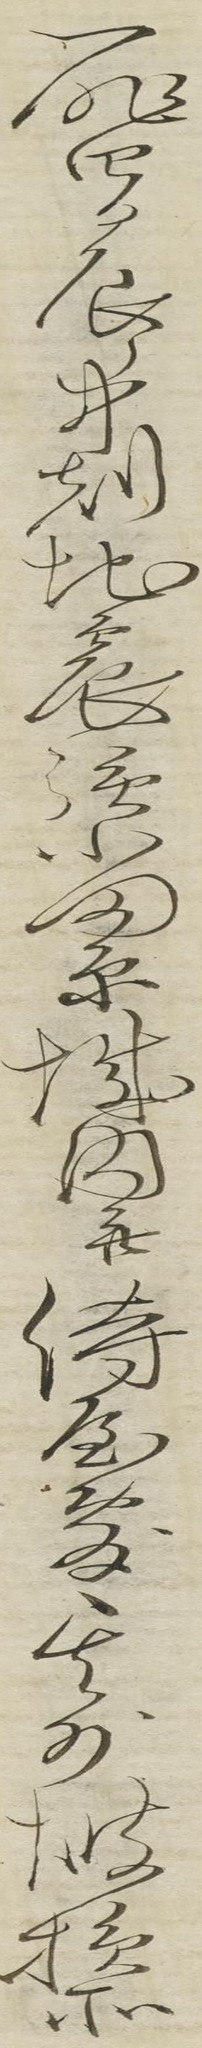一昨四日辰ノ中刻地震強小田原城内幷侍屋敷其外破損所
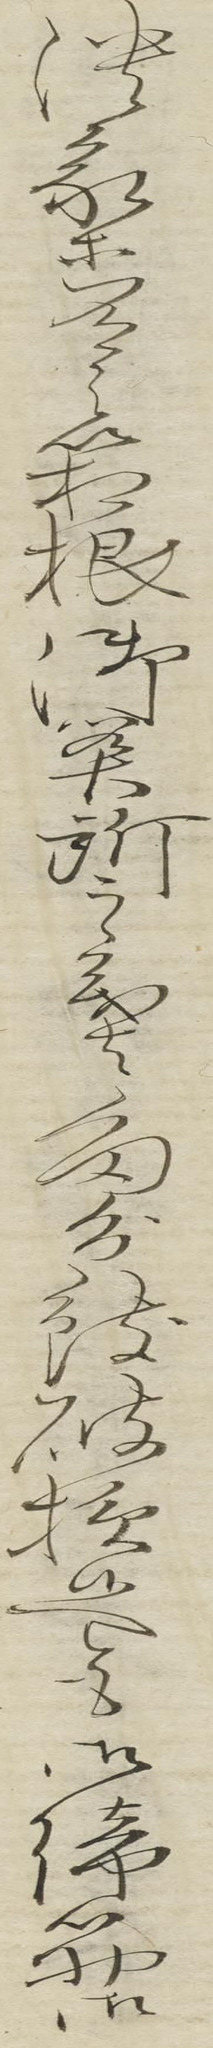潰家等有之箱根御関所の義は多分致破損候へとも御締筋御
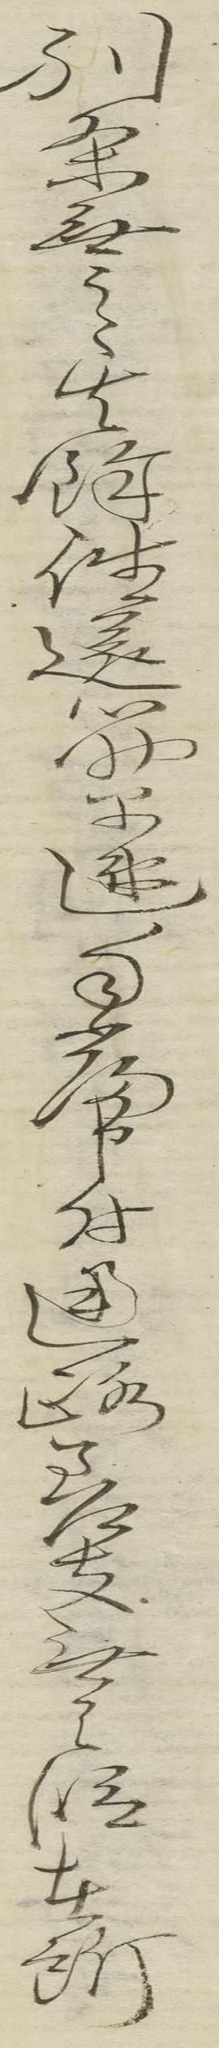別条無之其餘往還筋早速手当申付通路差支無之段在所
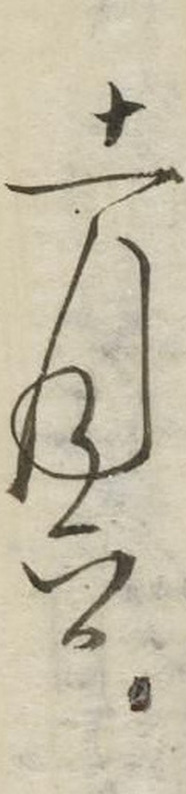十一月六日
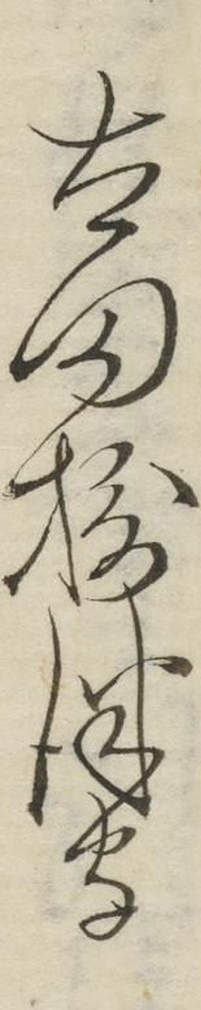太田摂津守
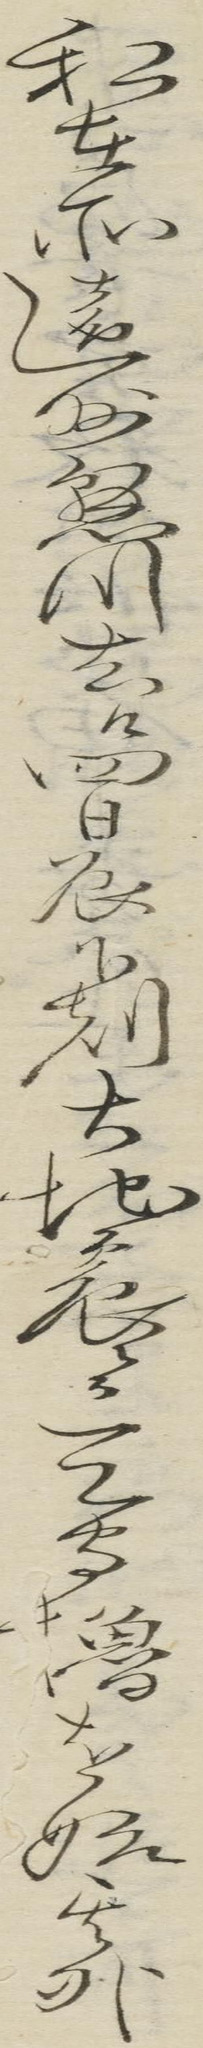私在所遠州熱川去ル四日辰下刻大地震ニ而天守櫓を始其外
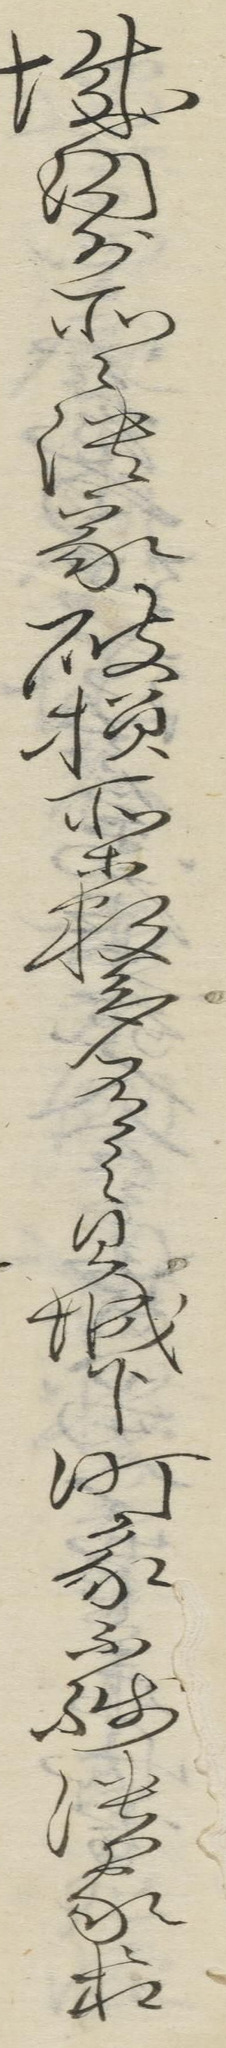城内外所々潰家破損所等数多有之且城下町家不残潰家ニ相
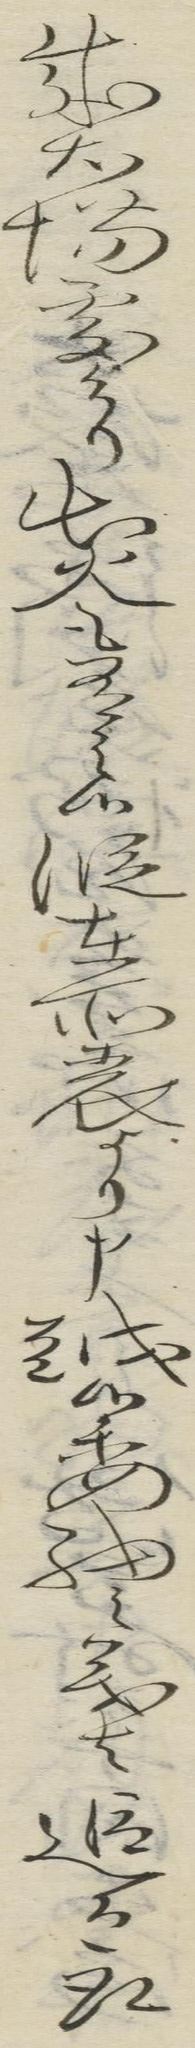成右場所より出火も有之候段在所表より申越候委細之義は追而取
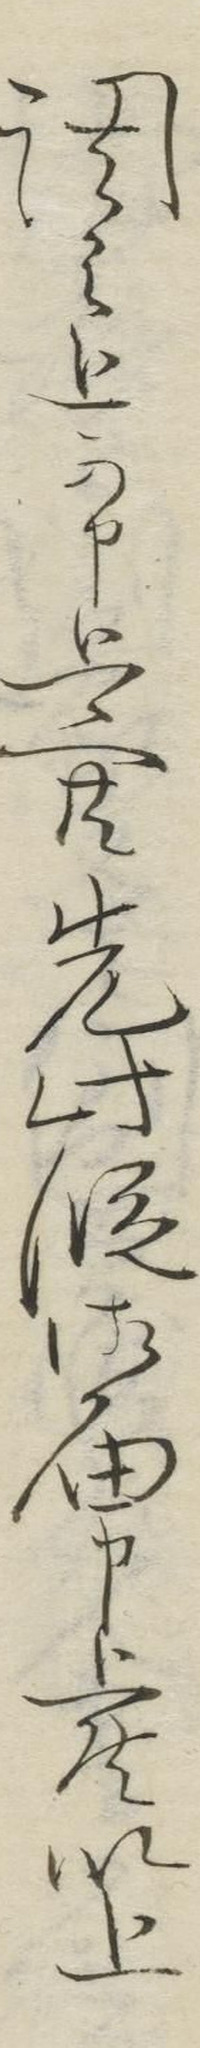調之上可申上候へ共先此段御届申上候以上
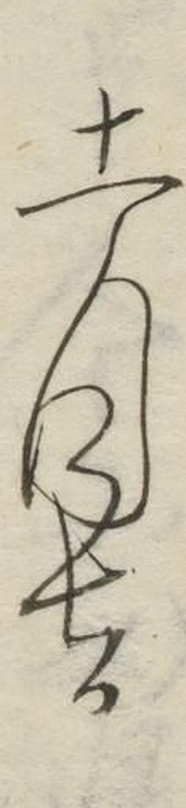十一月七日
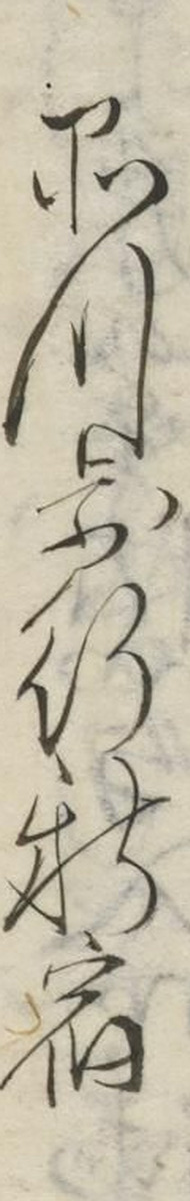品川歩行新宿
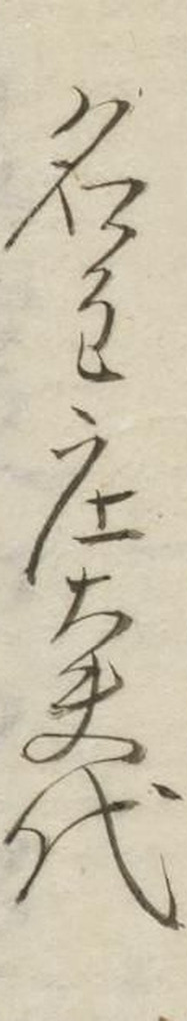名主庄太夫代
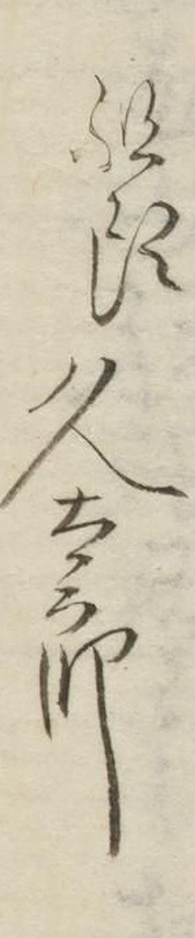組頭久太郎
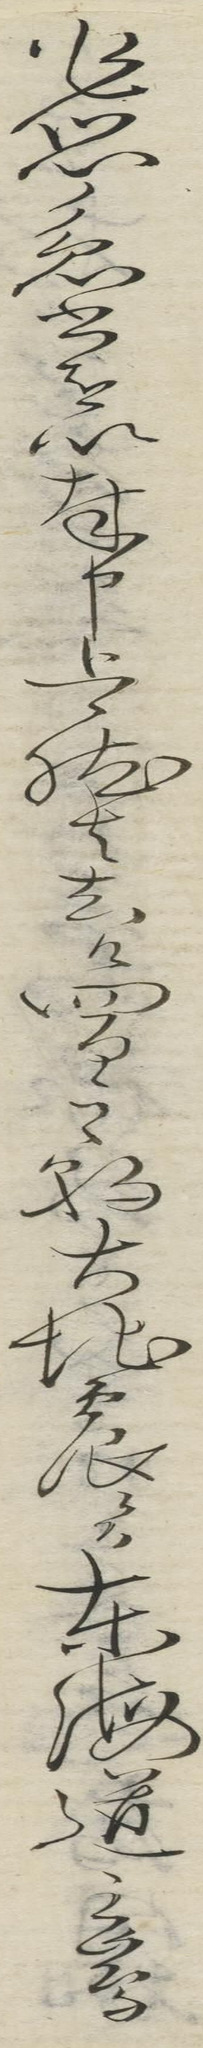乍恐急書を以奉申上候然は去ル四日の朝大地震ニ而東海道之嶌
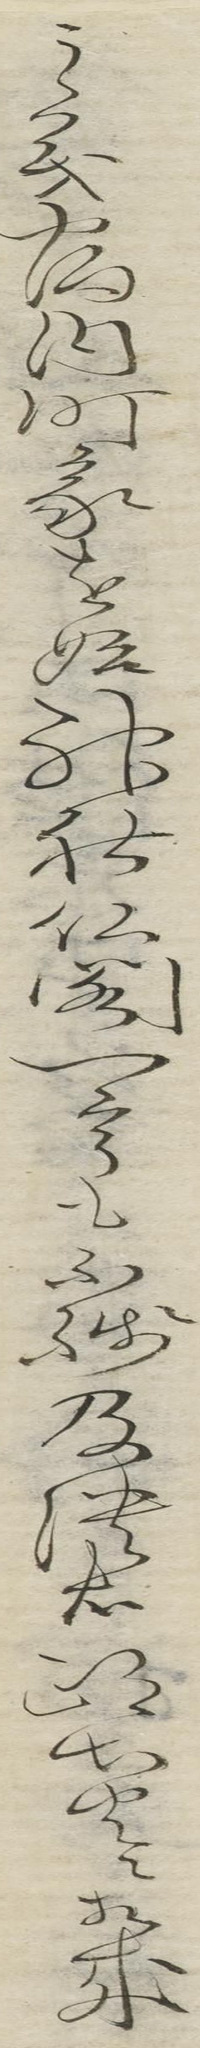之義宿内町家を始神社仏閣一宇も不残及潰右跡出火ニ相成

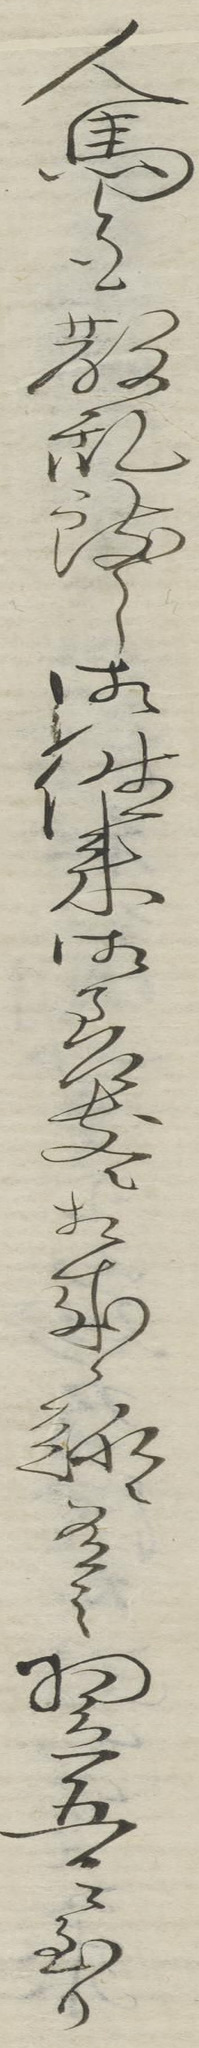人馬とも散乱致し御往来御差支ニ相成候趣有之翌五日ニ至り
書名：大地震實録
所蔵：東京大学地震研究所図書室 Earthquake Research Institute Library, The University of Tokyo, JAPAN
